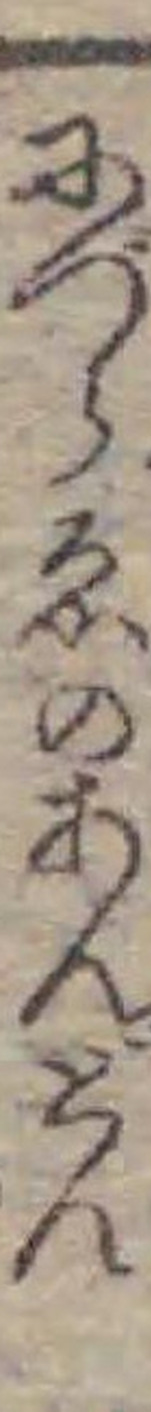にづらゑのあんどん
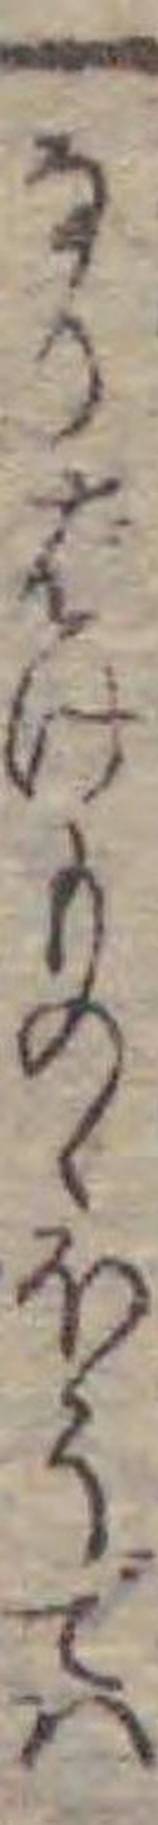なりばけものゝほうでは
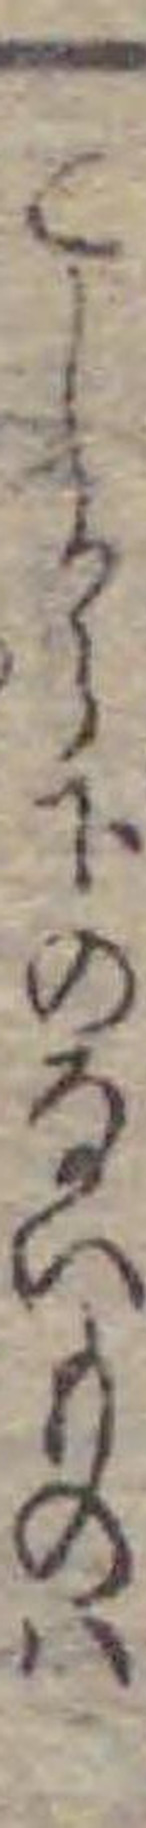こしから下のないものは
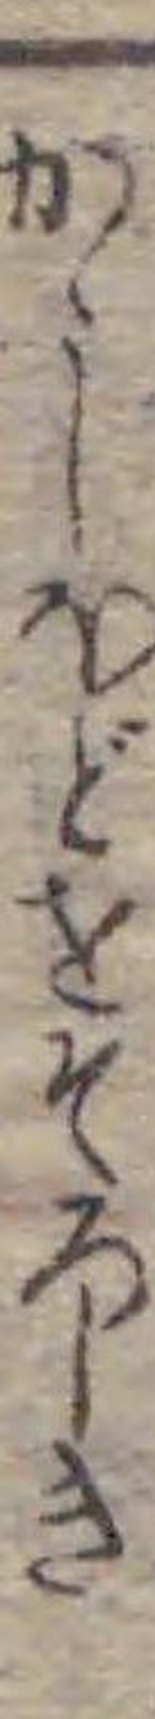かゝしほどをそろしき
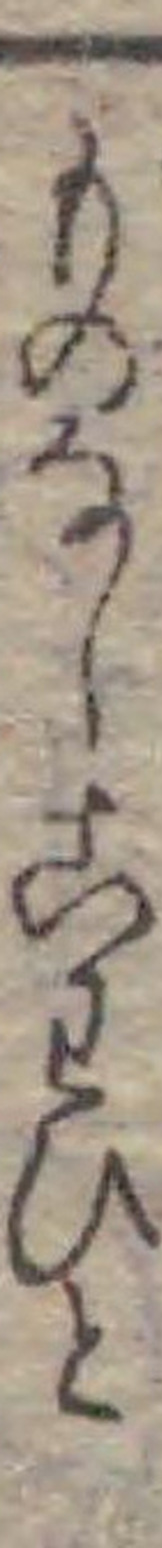ものなしこわひと
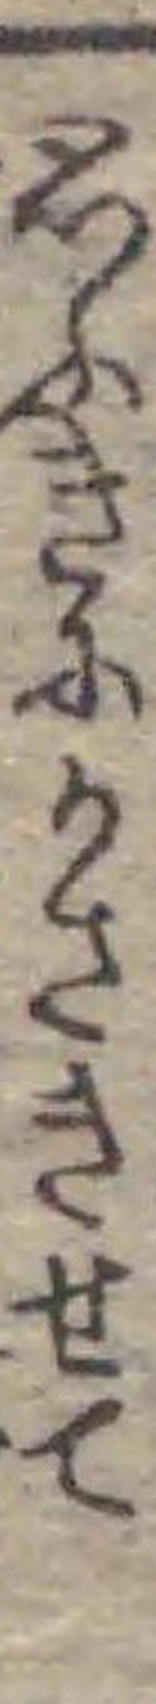思ふきにかさきせて
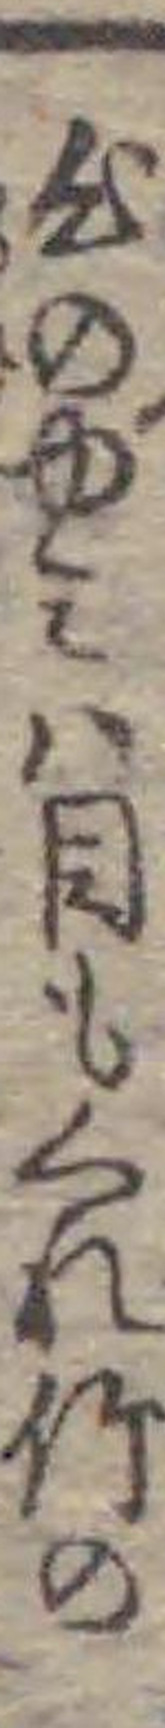心のゆみは目もくれ竹の
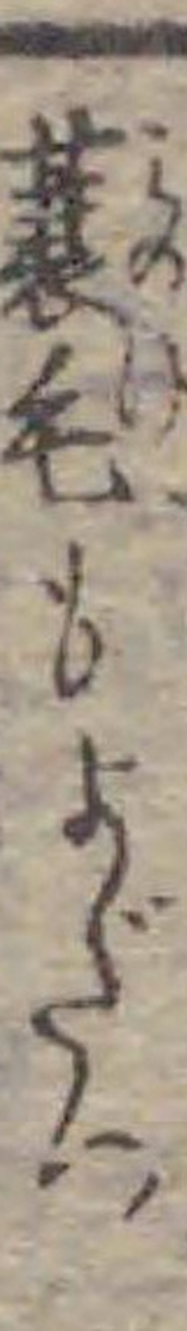簔毛もよだつ
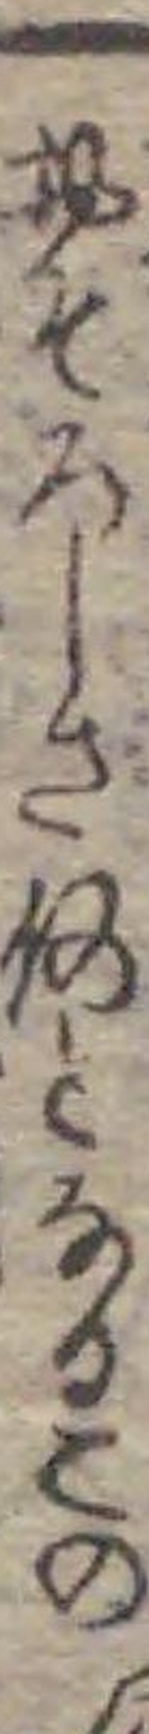おそろしさ何となるこの
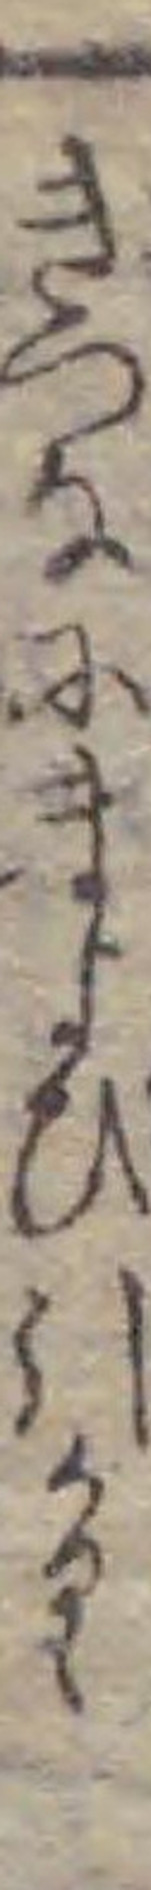きつなにまよひ引かるゝ
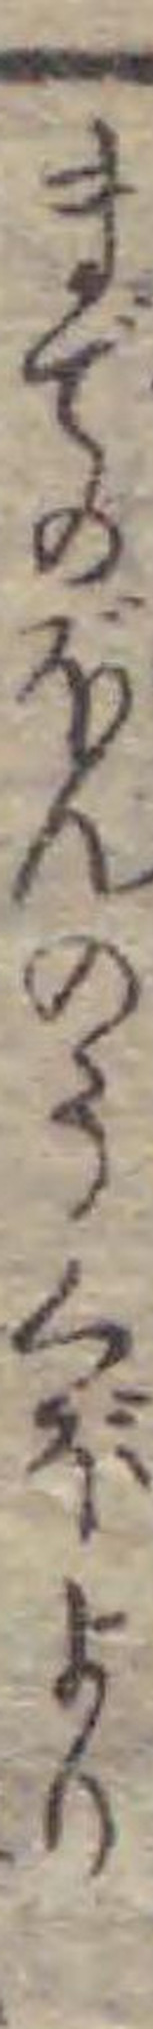までのぼんのうくぼより
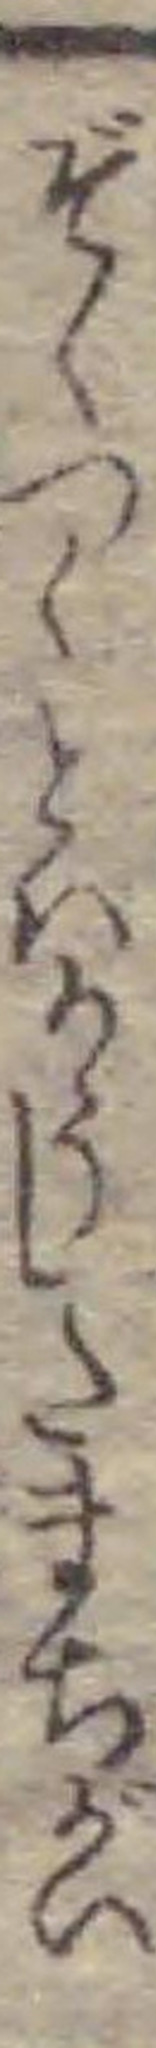ぞくつくとはかうしたまちがい
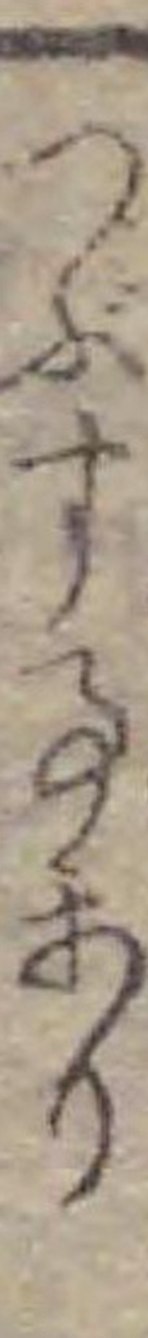つぶす事あり
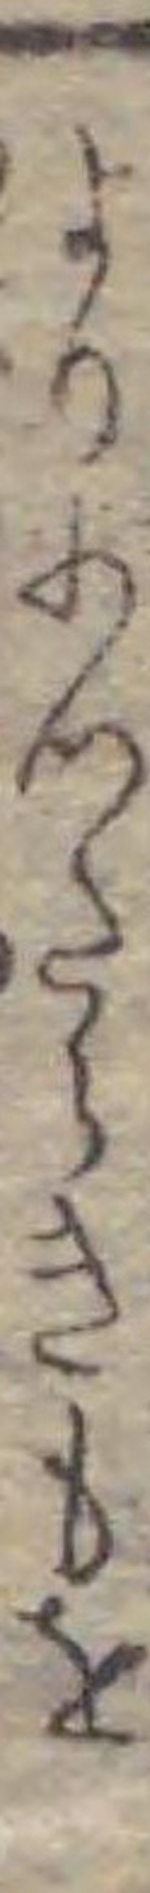よりあつたらきもを
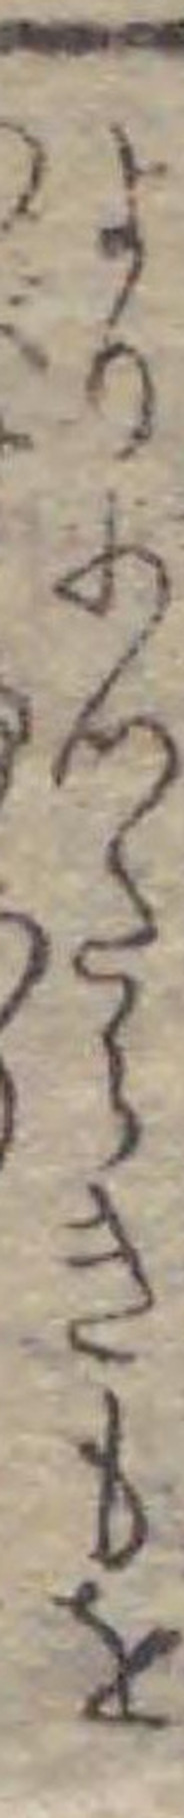よりあつたらきもを
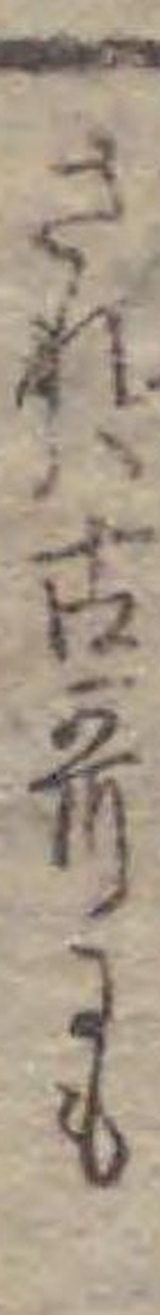されば古歌にも
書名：怪物つれつれ草 : 2巻
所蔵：国立国会図書館 National Diet Library, JAPAN
